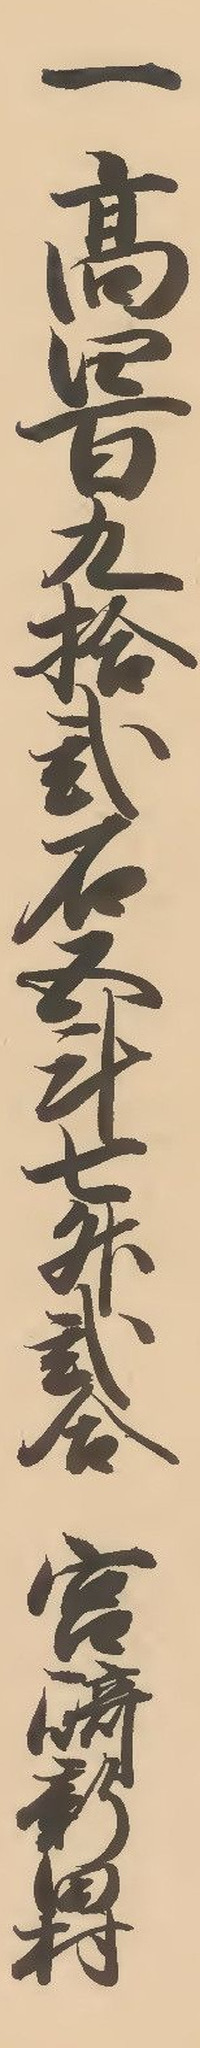一高四百九拾弐石五斗七升弐合宮崎新田村
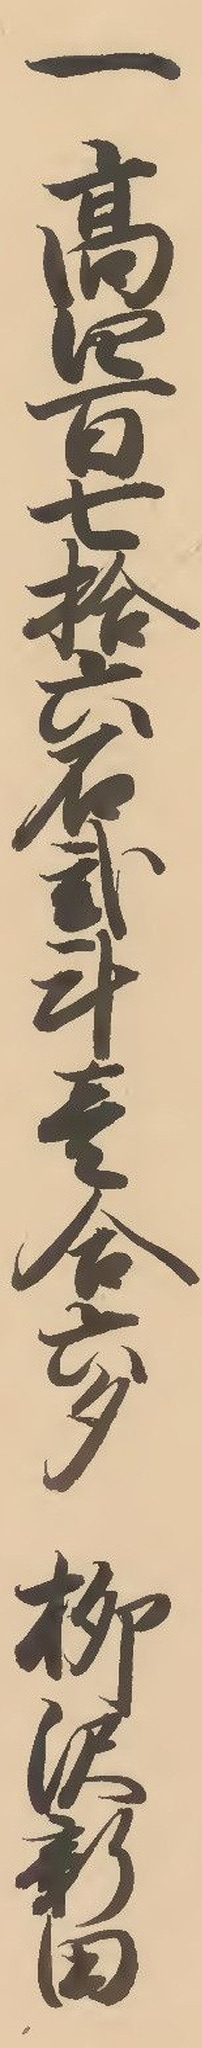一高四百七拾六石弐斗壱合六勺柳沢新田
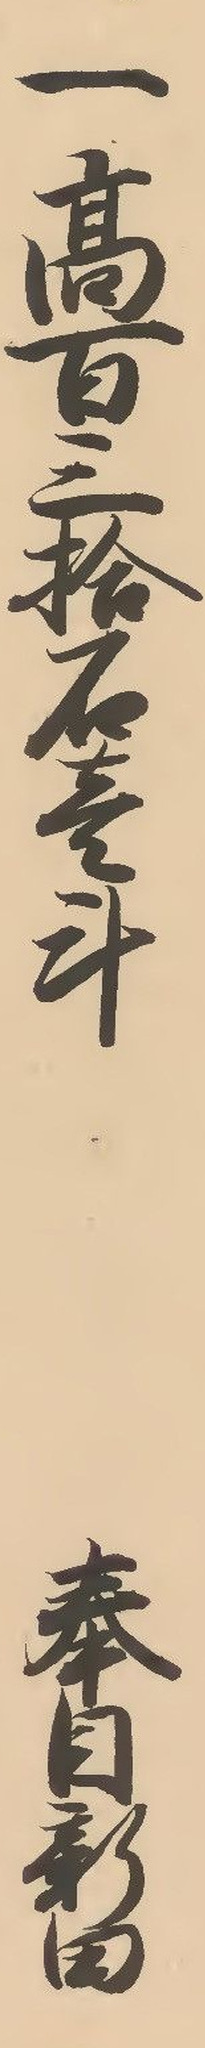一高百三拾石壱斗奉目新田
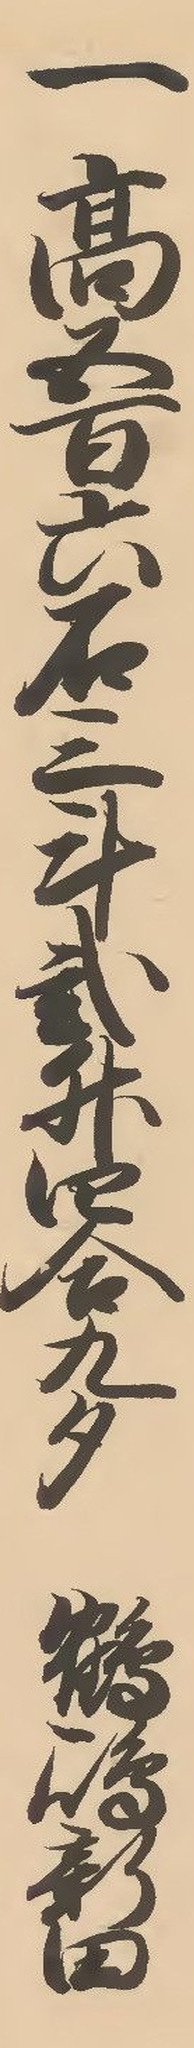一高五百六石三斗弐升四合九勺鶴島新田
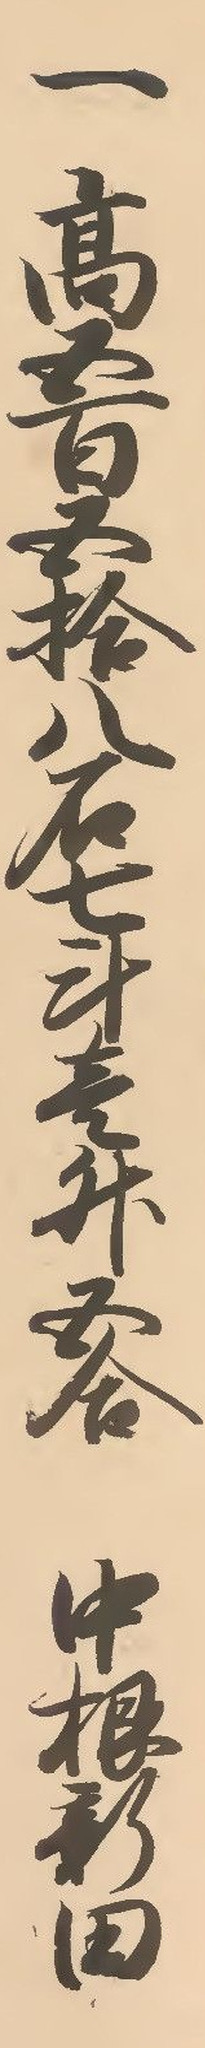一高五百五拾八石七斗壱升五合中根新田
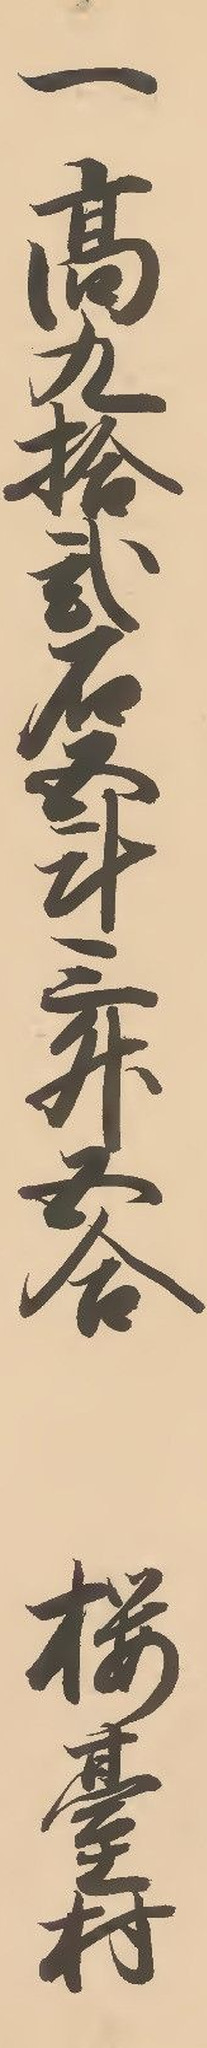一高九拾弐石五斗三升五合桜台村
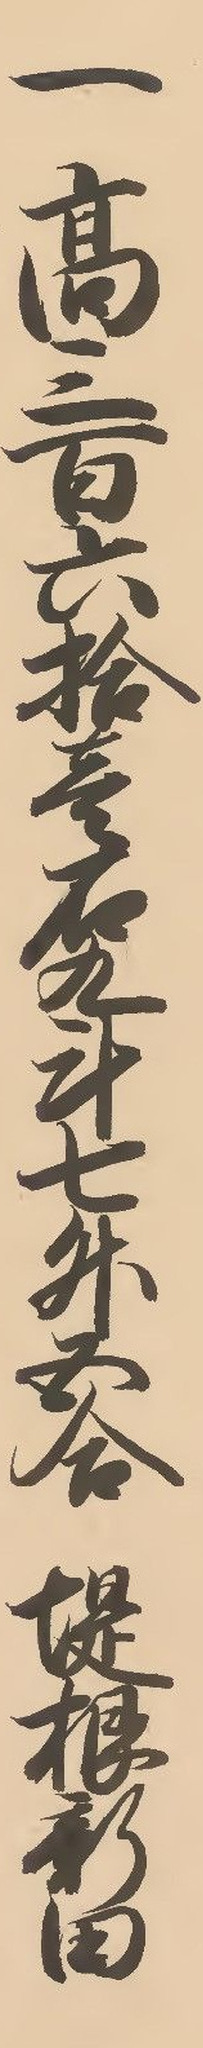一高三百六拾壱石九斗七升五合堤根新田
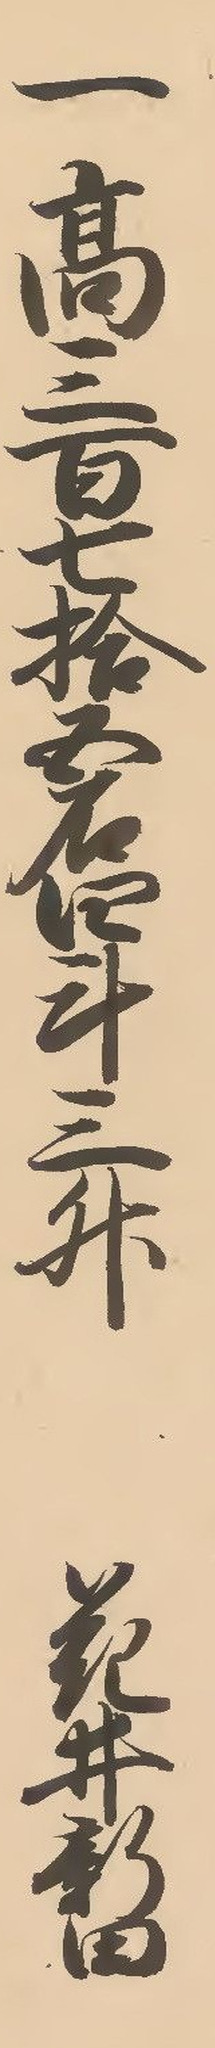一高三百七拾五石四斗三升花井新田

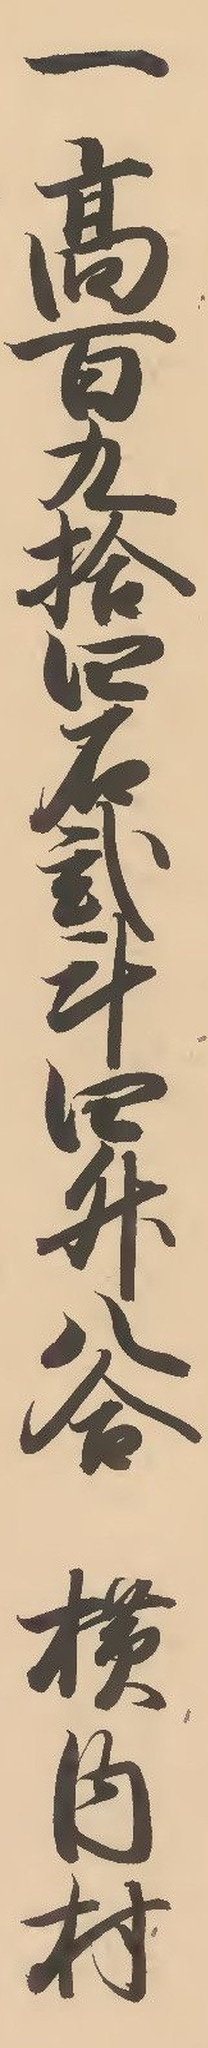一高百九拾四石弐斗四升八合横内村
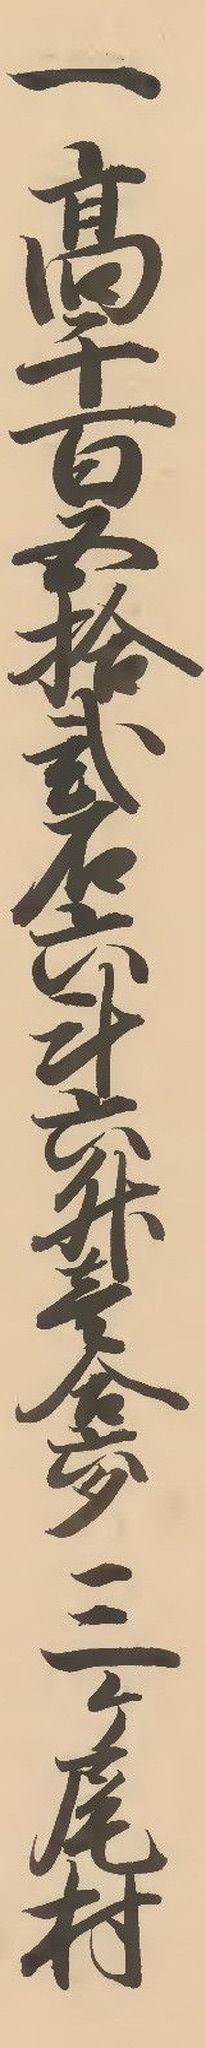一高千百五拾弐石六斗六升壱合六勺三ヶ尾村
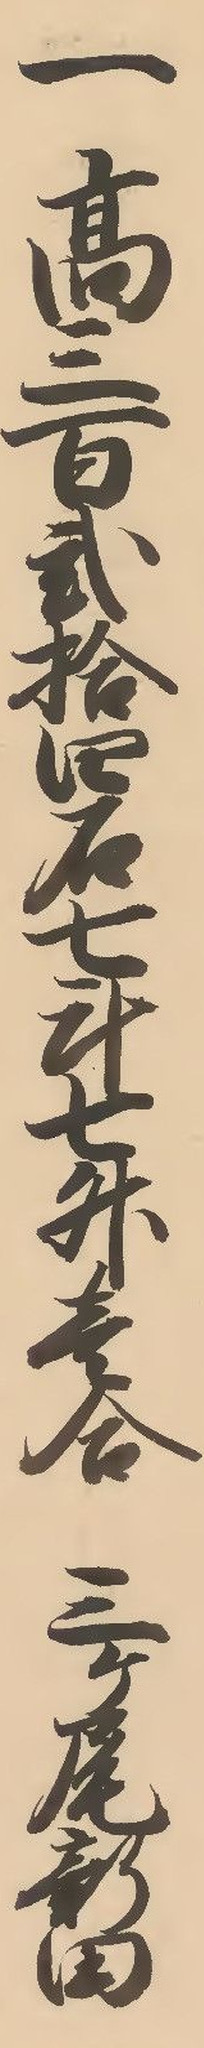一高三百弐拾四石七斗七升壱合三ヶ尾新田
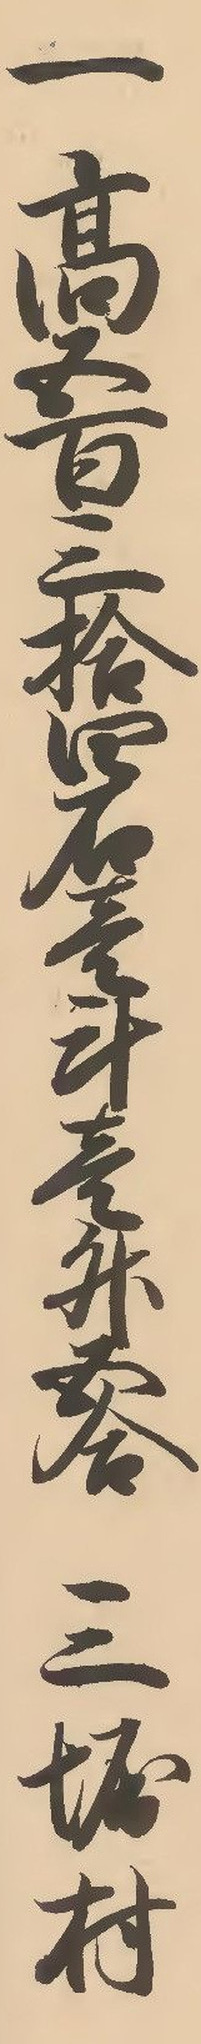一高五百三拾四石壱斗壱升五合三堀村
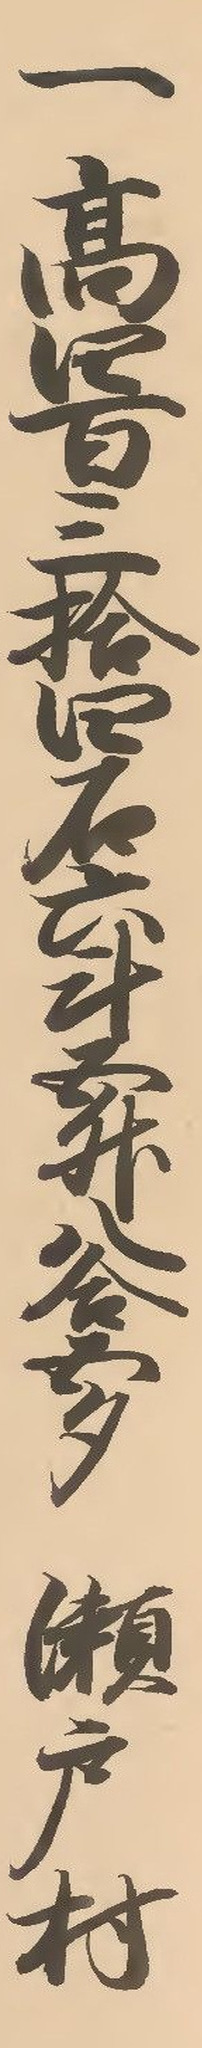一高四百三拾四石六斗五升八合五勺瀬戸村
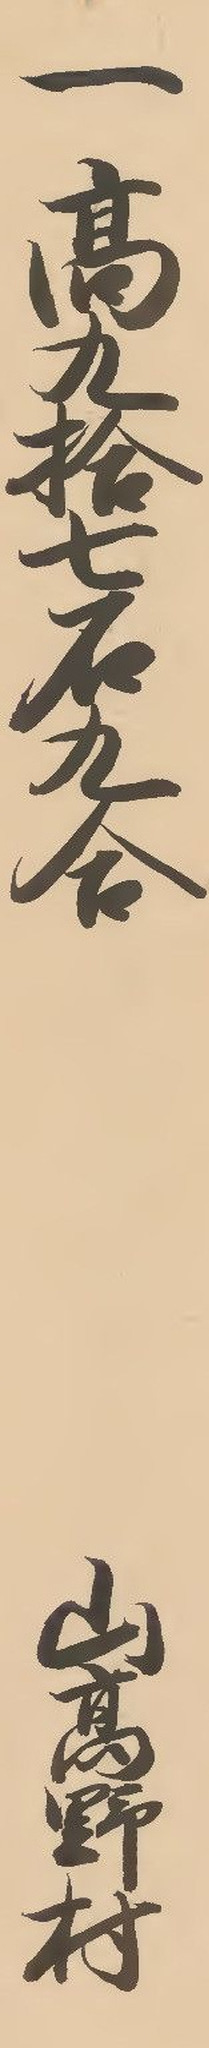一高九拾七石九合山高野村
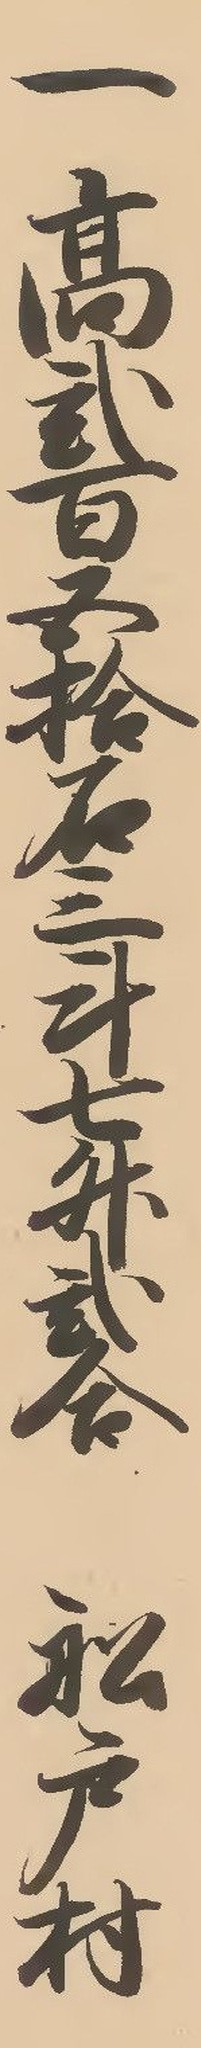一高弐百五拾石三斗七升弐合船戸村
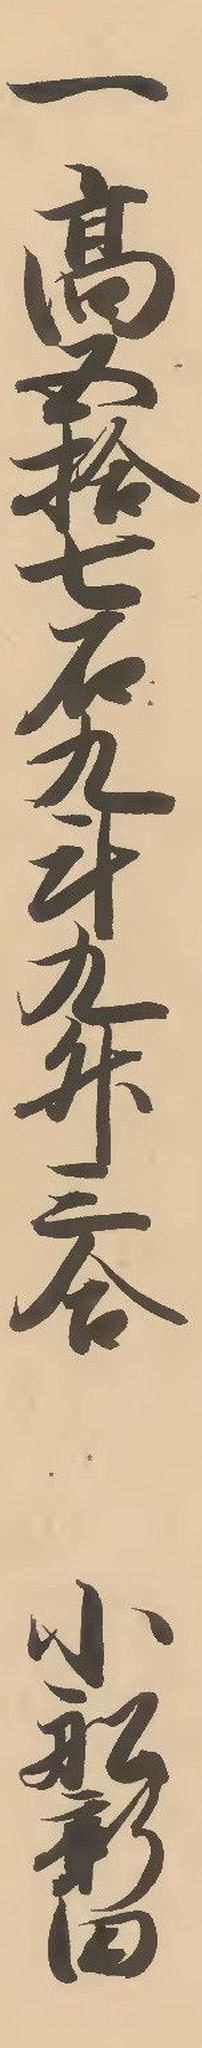一高五拾七石九斗九升三合小船新田
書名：下総国郷帳
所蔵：国立公文書館 National Archives of Japan
